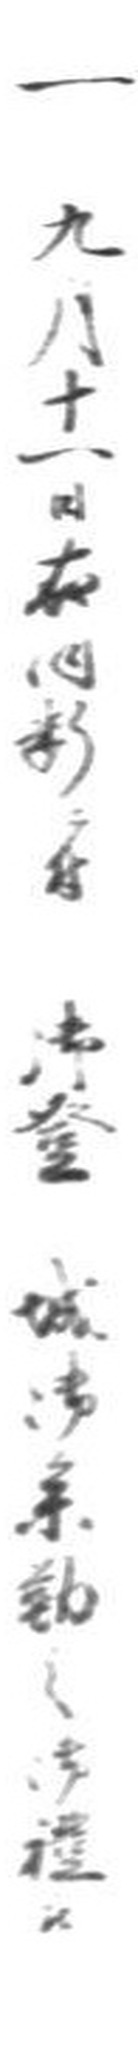一九月十一日右同断ニ付御登城御参勤之御礼被
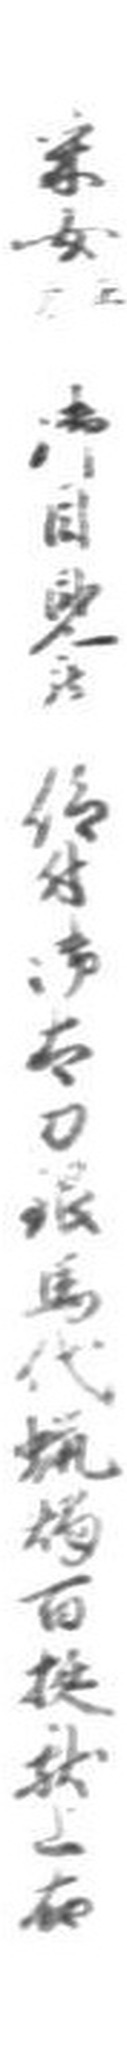方御目見被仰付御太刀銀馬代蝋燭百挺献上右
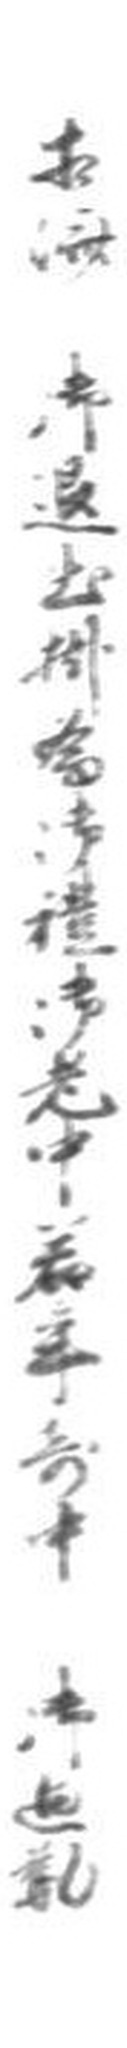相済御退出掛為御礼御老中若年寄中御廻勤
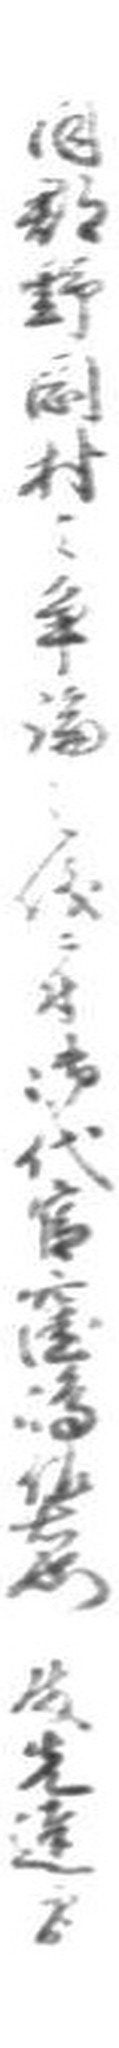同郡野岡村与争論之儀ニ付御代官窪嶋作右衛門殿先達而ゟ
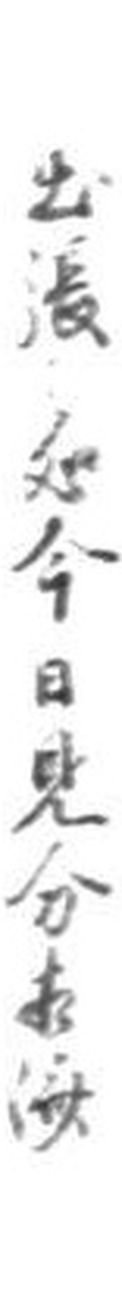出張候処今日見分相済

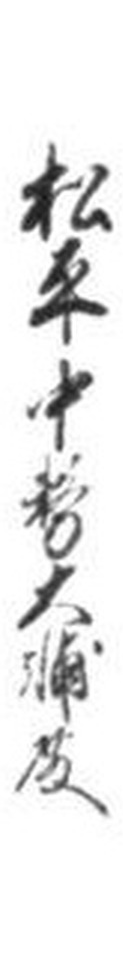松平中務大輔殿
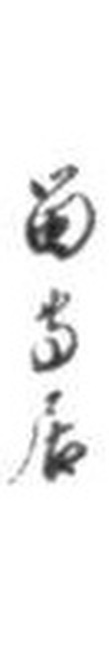留守居
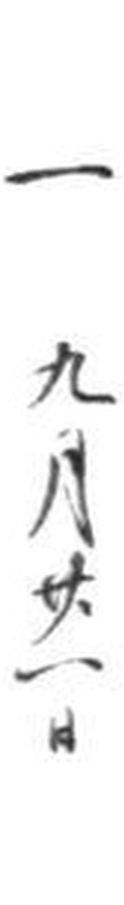一九月廿一日
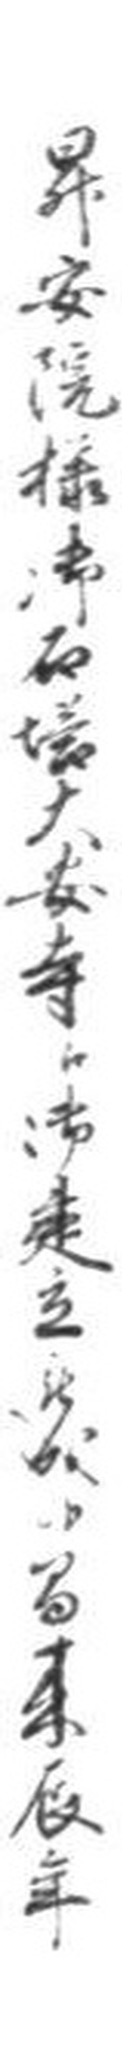昇安院様御石塔大安寺江御建立被成候間辰年
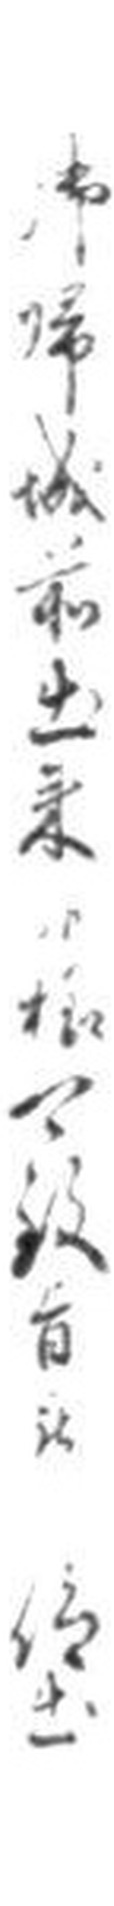御帰城前出来候様可致旨被仰出
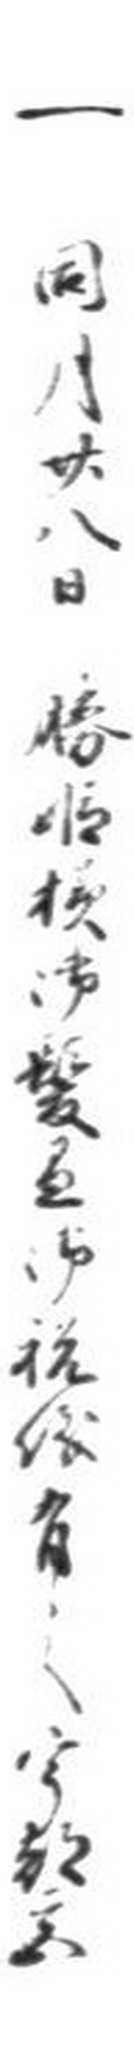一同月廿八日勝姫様御髪置御祝儀有之宇都宮
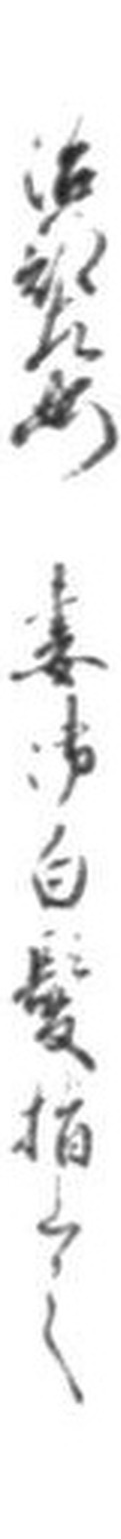治部左衛門妻御白髪指上之
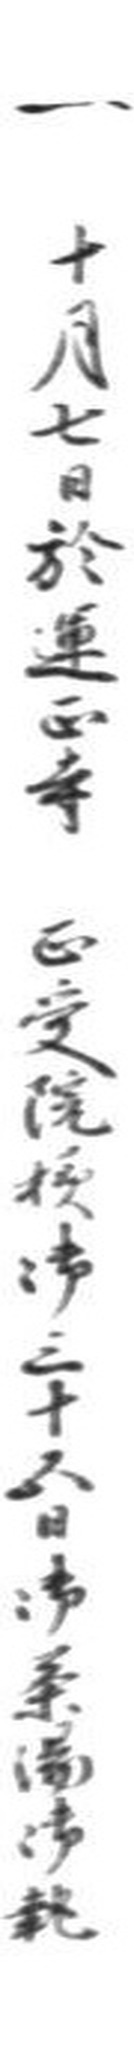一十月七日於運正寺正受院様御三十五日御茶湯御執
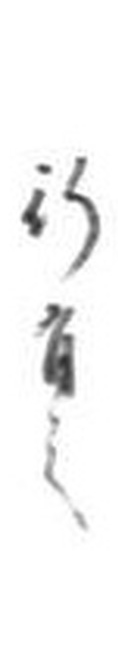行有之
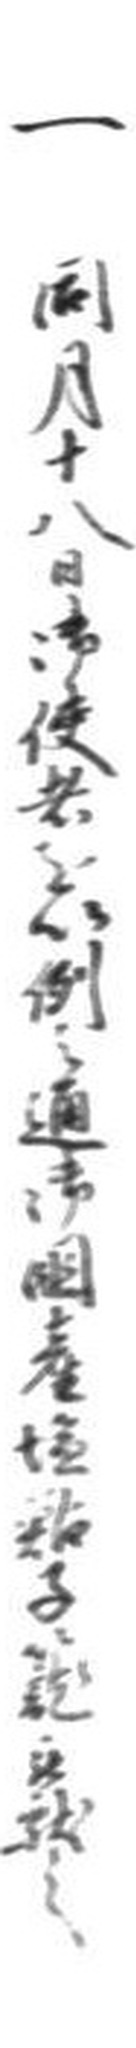一同月十八日御使者を以例之通御国産塩鮎子籠被献之
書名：家譜 三十六 宗昌公 従享保八年到同九年
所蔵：福井県文書館 Fukui Prefectural Archives
